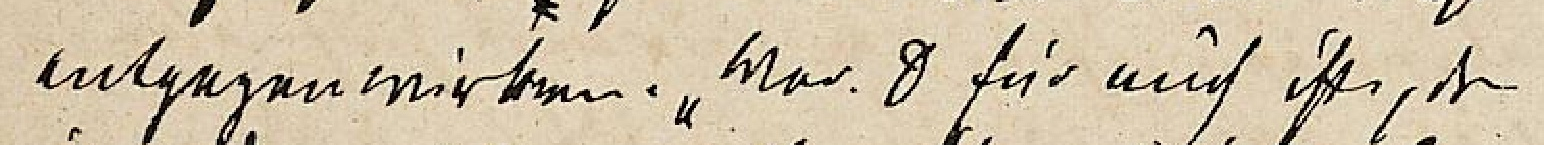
entgegenwirken. "Wer o für mich ist, der
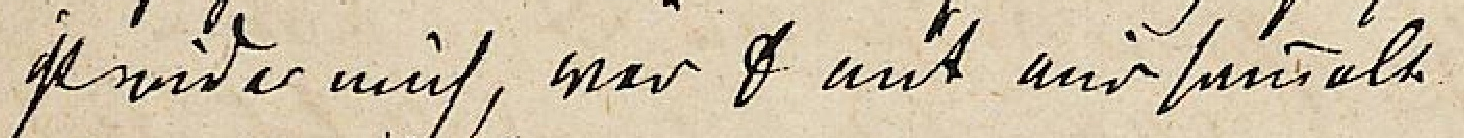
ist wider mich, wer o mit mir samelt
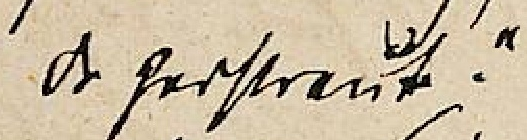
der zerstreut."
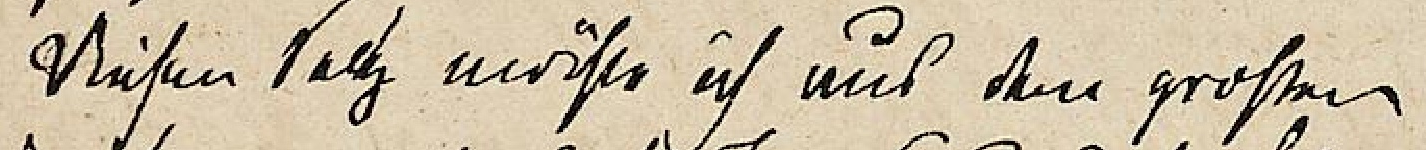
Diesen Satz möchte ich uns den großen
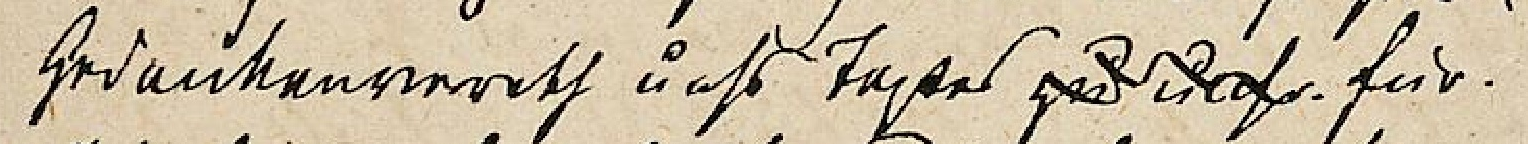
Gedankenwerth uns. Textes zu unsr. für
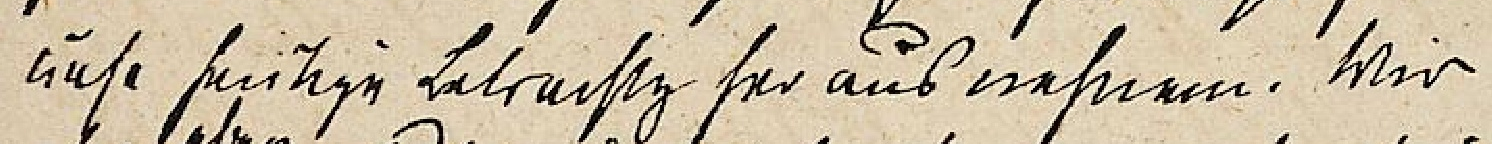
unsr heutige Betrachtg snr ausnehmen. Wir
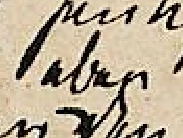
eben
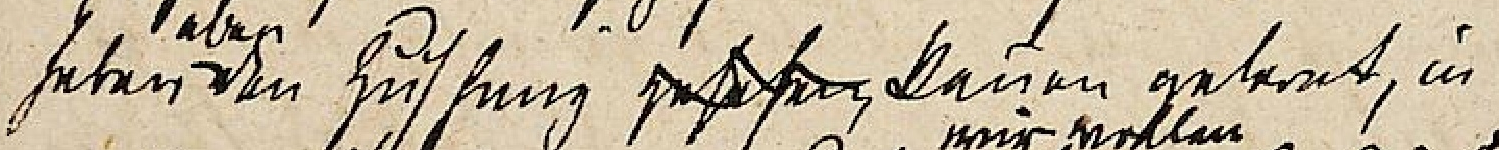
haben den Zushang gesehen, kenen gelernt, in
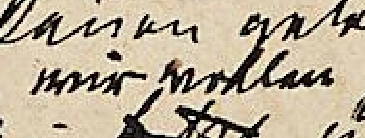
wir wollen
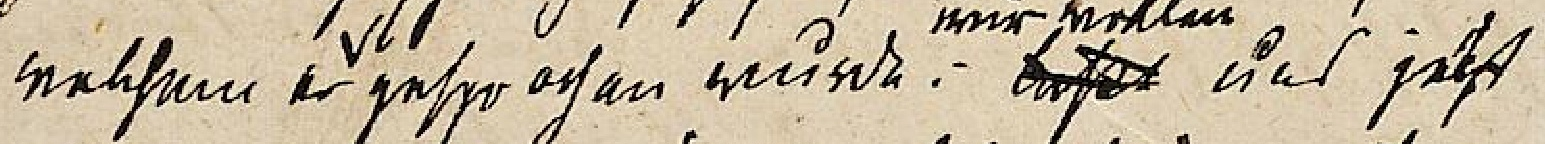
welchem er gesprochen wurde. Laßt uns jetzt
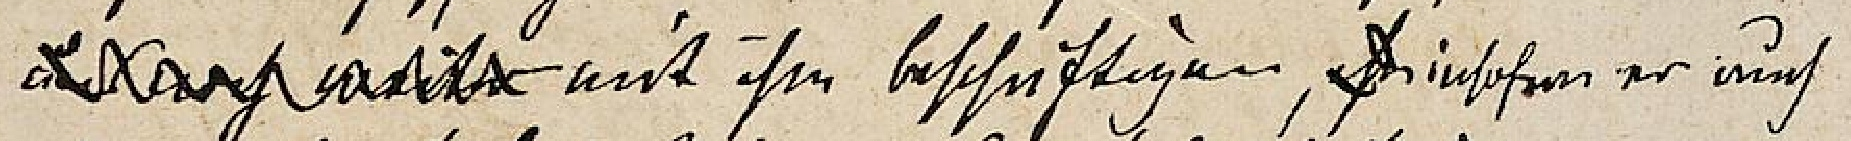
uns noch weiter mit ihm beschäftigen, ihn insofern er auch
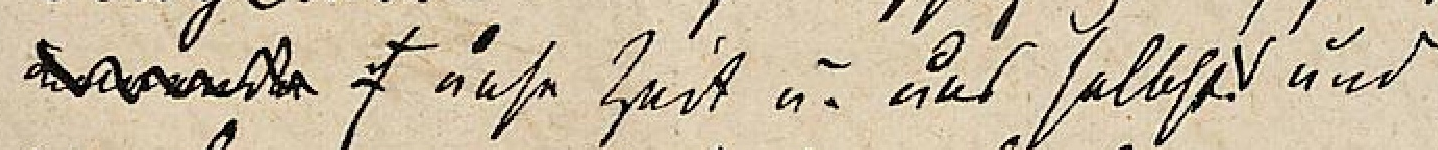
anwenden f unsr Zeit u uns selbst V und
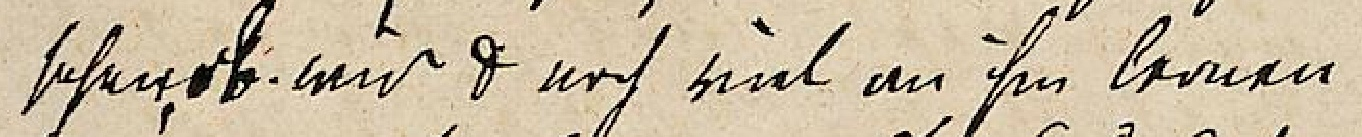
sehen, ob wir o noch viel an ihm lernen
